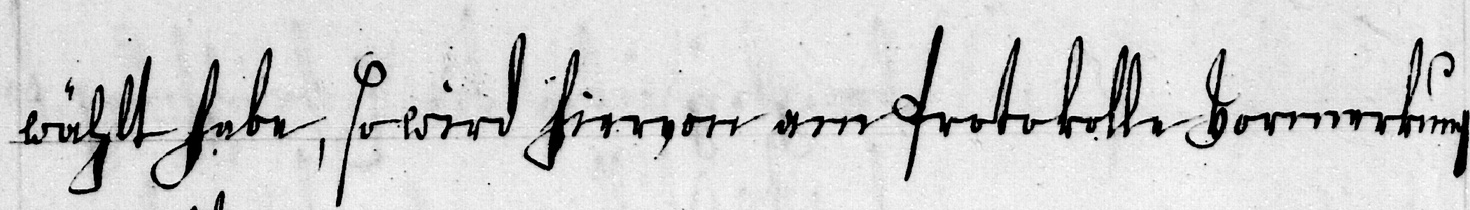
wählt habe, so wird hiervon am Protokolle Vormerkung
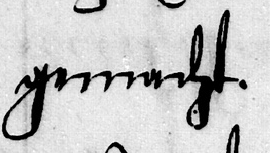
gemacht.
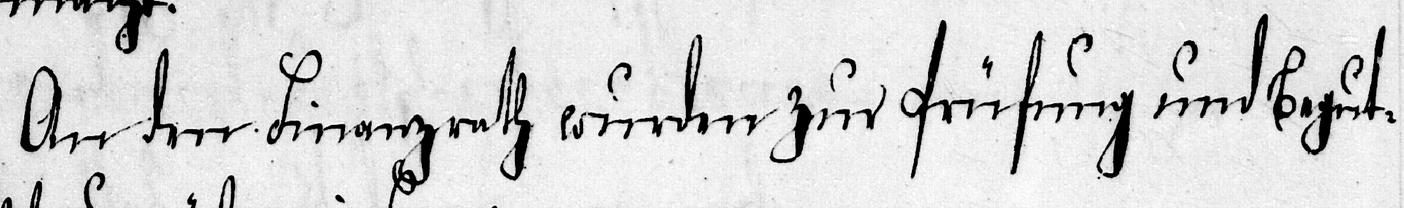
An den Finanzrath wurden zur Prüfung und Begut¬
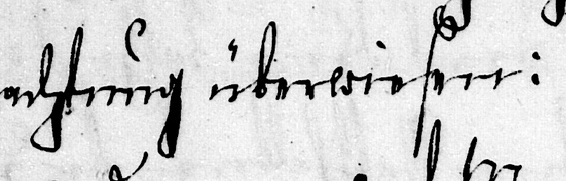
achtung überwiesen:
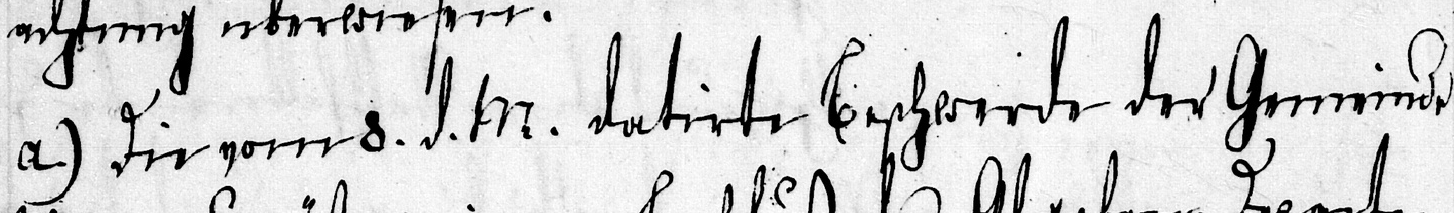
a.) Die vom 8. d. M. datirte Beschwerde der Gemeinde
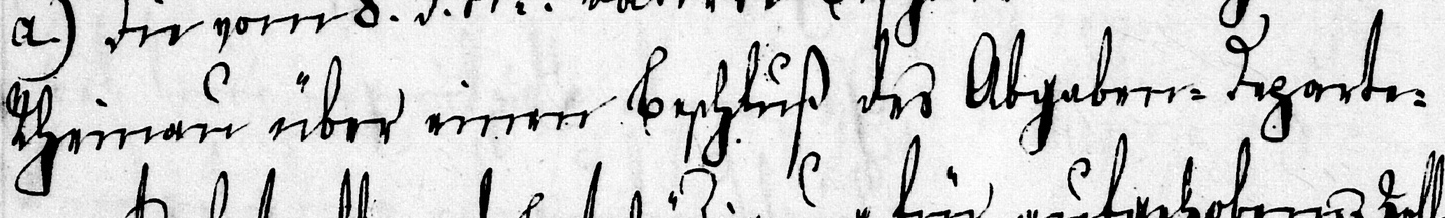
Rheinau über einen Beschluß des Abgaben-Departe¬
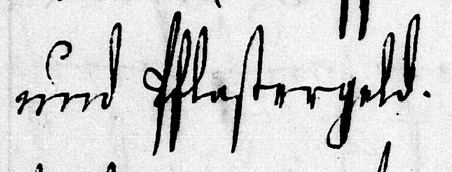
und Pflastergeld.
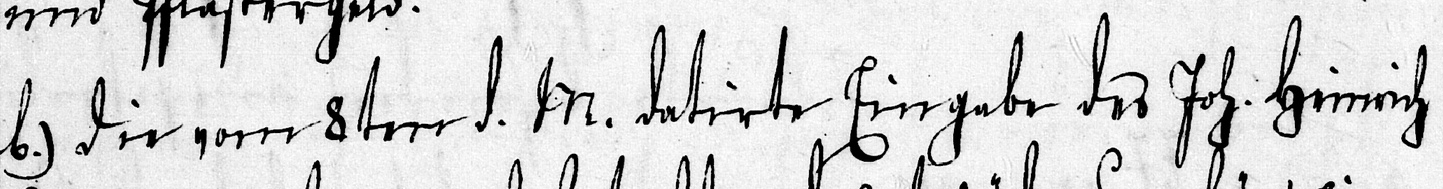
b.) Die vom 8ten d. M. datirte Eingabe des Joh. Heinrich
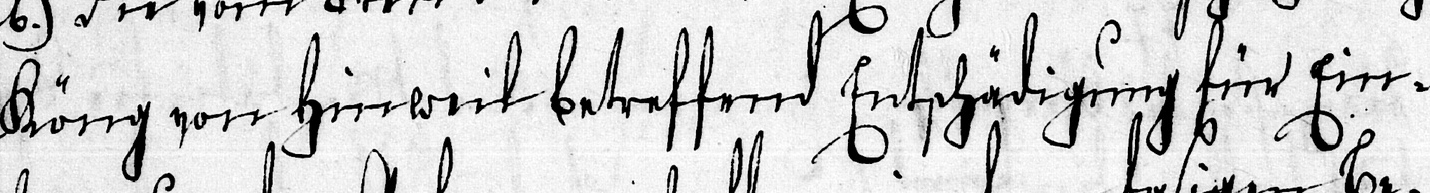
Köng von Hinweil betreffend Entschädigung für Ein¬
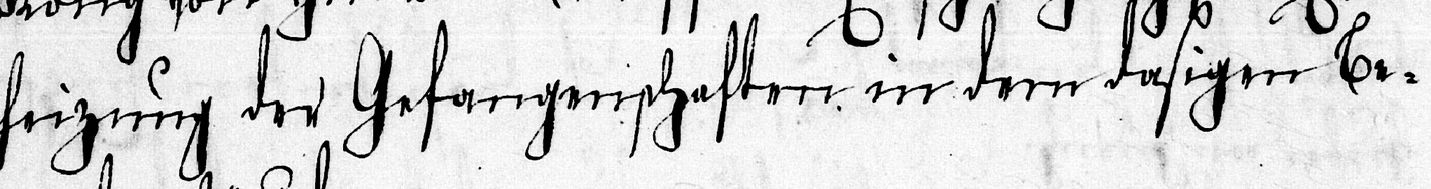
heizung der Gefangenschaften in dem dasigen Be¬
